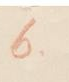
A.
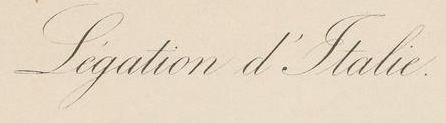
Légation d'Italie.
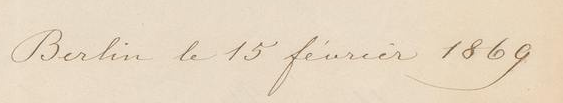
Berlin le 15 février 1869
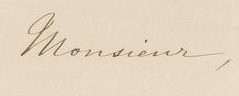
Monsieur,
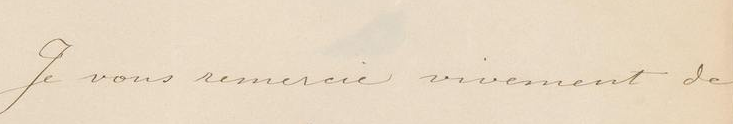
Je vous remercie vivement de
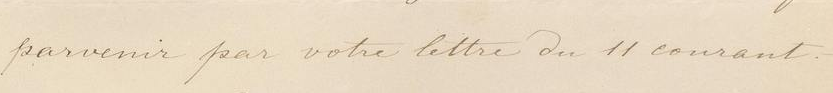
parvenir par votre lettre du 11 courant.
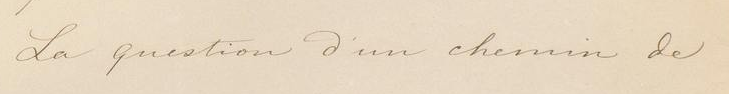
La question d'un chemin de
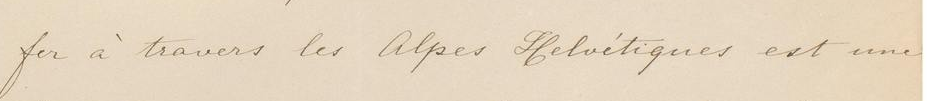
fer à travers les Alpes Helvétiques est une
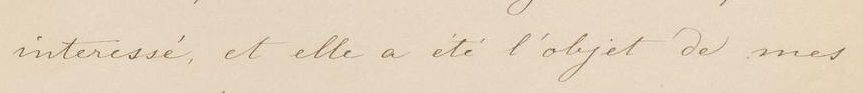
interessé, et elle a été l'objet de mes
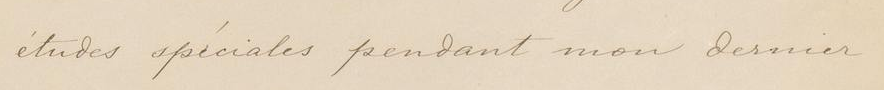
études spéciales pendant mon dernier
